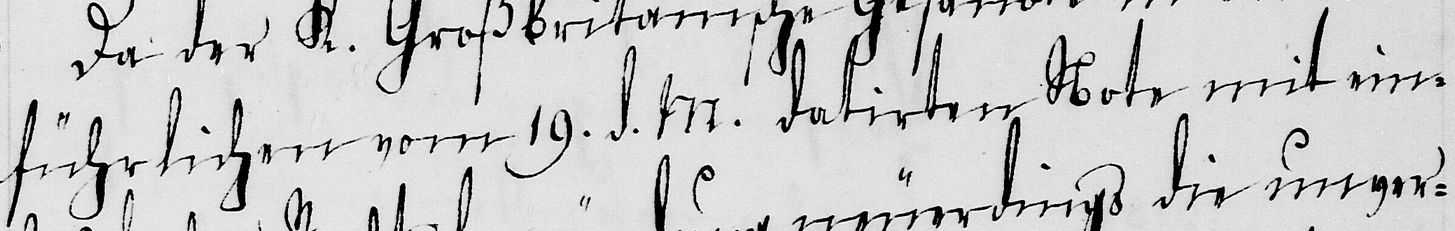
führlichen vom 19. d. M. datirten Note mit ein¬
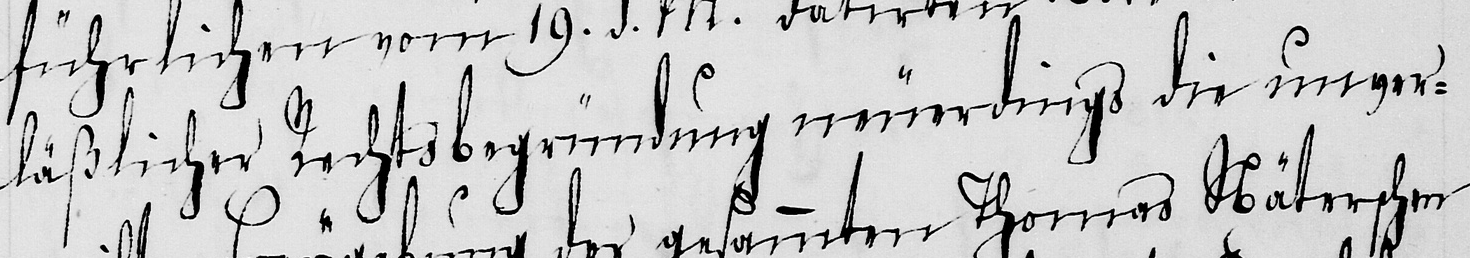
läßlicher Rechtsbegründung neuerdings die unver¬
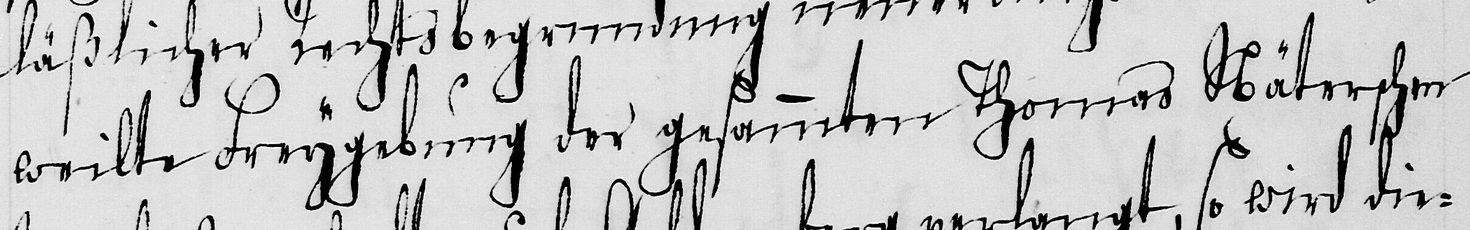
weilte Freygebung der gesammten Thomas Näterschen
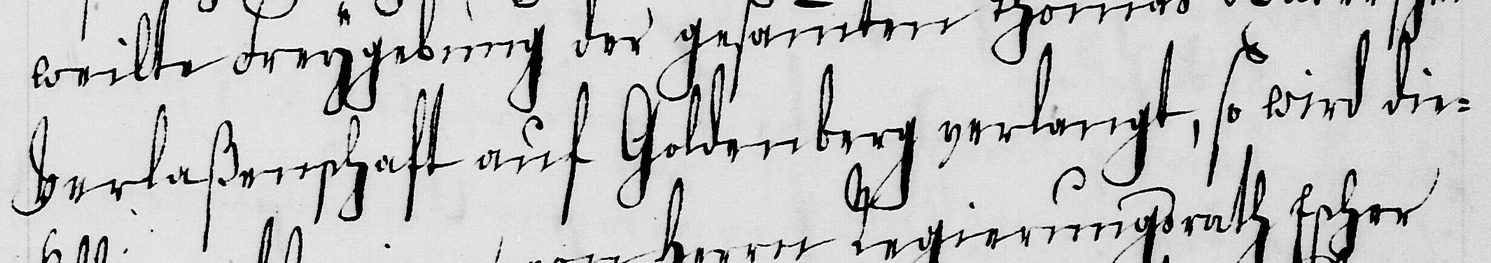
Verlaßenschaft auf Goldenberg verlangt, so wird di¬
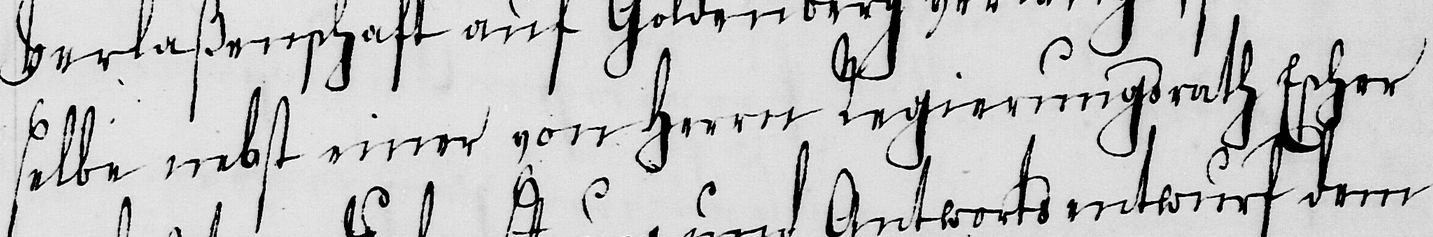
selbe nebst einer von Herrn Regierungsrath Escher
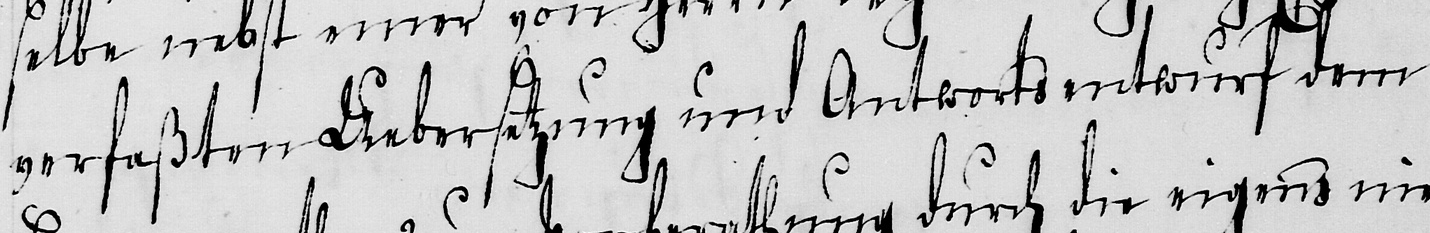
verfaßten Uebersetzung und Antwortsentwurfe dem
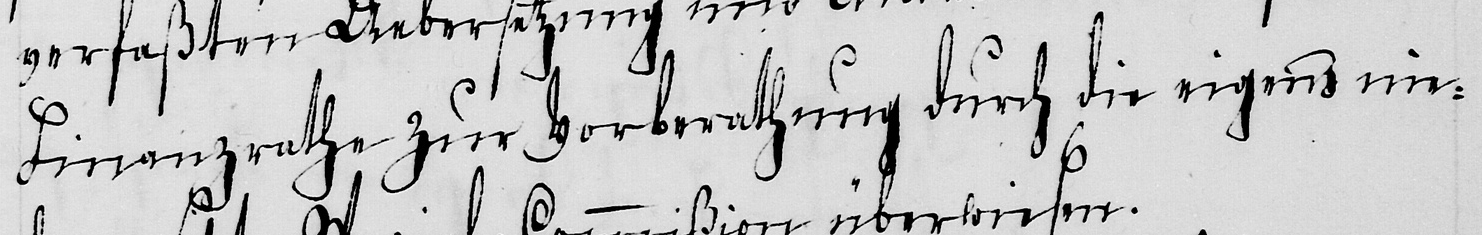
Finanzrathe zur Vorberathung durch die eigens nie¬
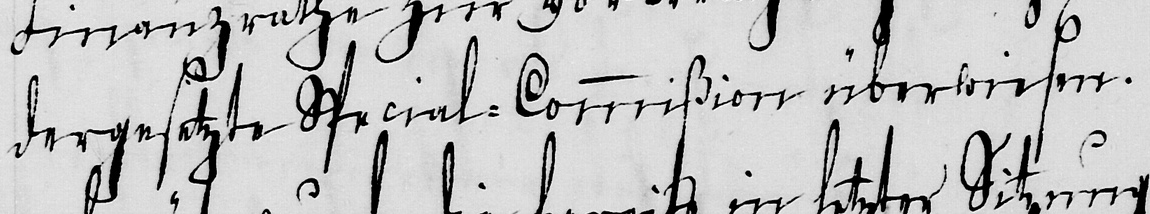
dergesetzte Special-Commißion überwiesen.
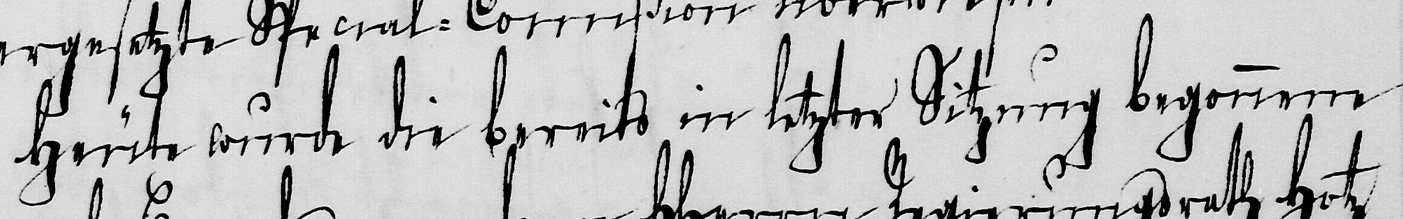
Heute wurde die bereits in letzter Sitzung begonnene
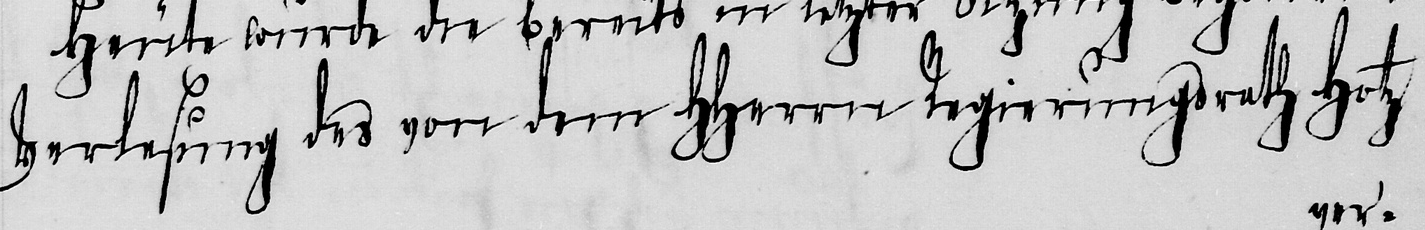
Verlesung des von dem HHerrn Regierungsrath Hotz
